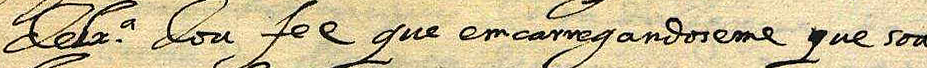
de lx.a dou fee que emcarregandoseme que sou
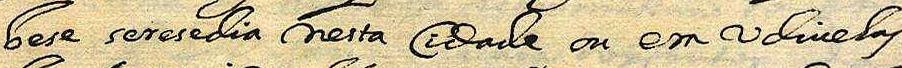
bese se resedia nesta Cidade ou em odiuelas
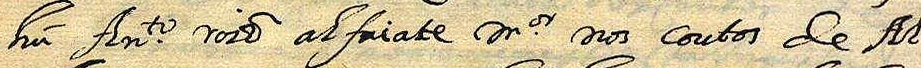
hū An.to roiz̄ alfaiate m.or nos coutos de Al
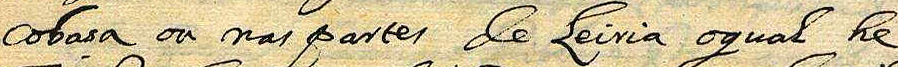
cobaça ou nas partes de Leiria o qual he
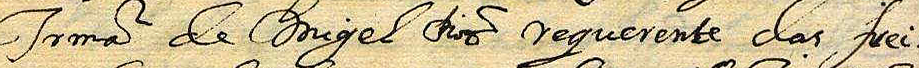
Jrmaõ de Migel Roz̄ requerente das frei
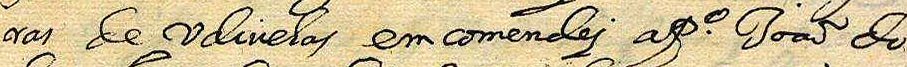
ras de odiuelas emcomendej a p.o Ioaõ do
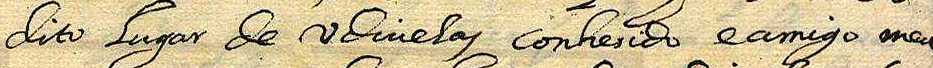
dito Lugar de odiuelas conhesido e amigo meu
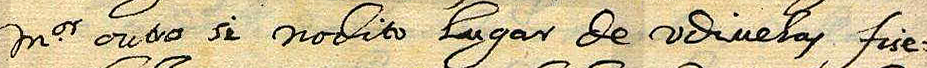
m.or outrosi no dito Lugar de odiuelas fise
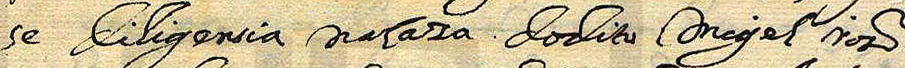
se diligensia na Caza do dito Migel roz̄
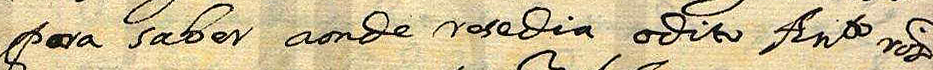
para saber aonde resedia o dito Anto roz̄
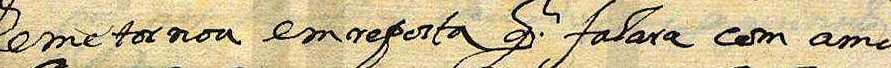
e me tornou em reposta q̄. falara com a mo
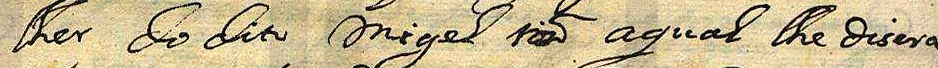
lher do dito Migel roz̄ a qual lhe disera
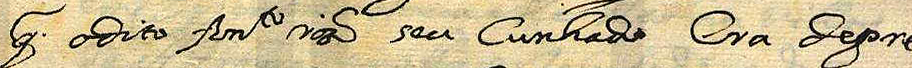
q̄. o dito Anto roz̄ seu Cunhado Era de pre
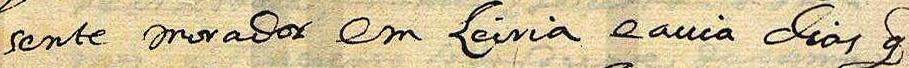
sente morador em Leiria e auia dias q̄.
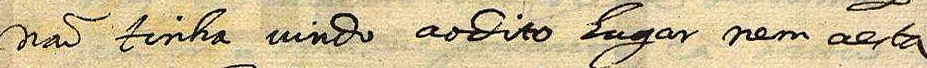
naõ tinha uindo ao dito lugar nem a esta
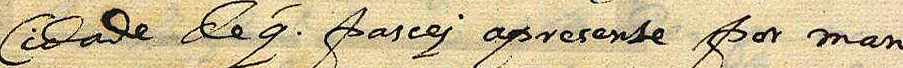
Cidade de q̄. pascej a presente por man
